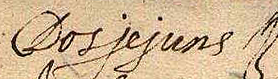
Dos jejuns
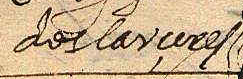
dos Carçeres
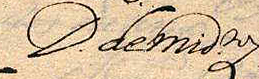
Dos. de mid.ros
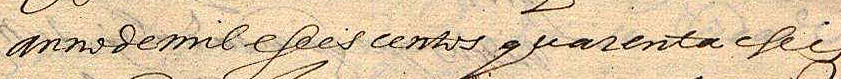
anno de mil e seiscentos quarenta e seis
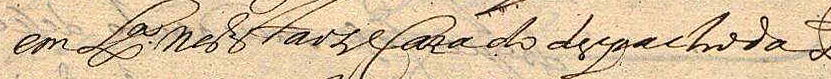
em Lxa. nos Estaos e Caza do despacho da sta.
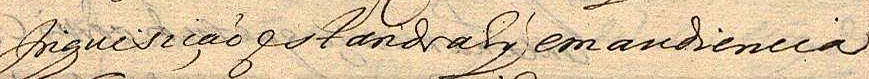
Jnquisiçaõ estando ahy em audiencia
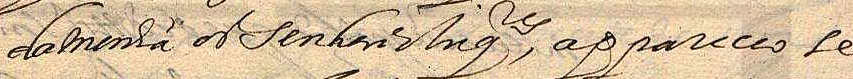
da menhã os senhores Inqres, appareceo sē
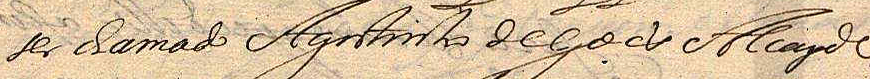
ser chamado Agostinho de Goes Alcayde
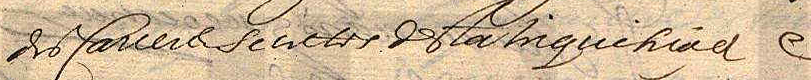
dos Carceres secretos desta Inquisiçaõ e
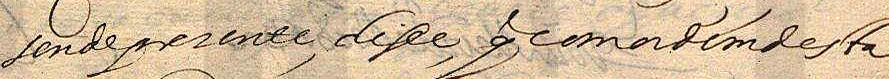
sendo prezente, disse, q̄ com ordem desta
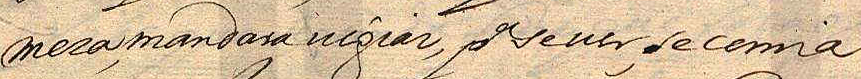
meza, mandara uigiar, pa se uer se comia
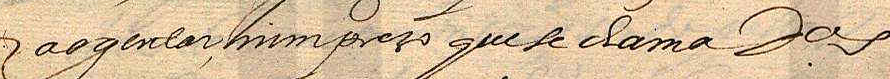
ao gentar, hum prezo que se chama D.os
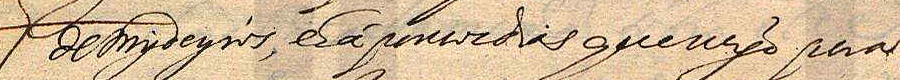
de mydeyros, e há poucos dias que ueȳo pera
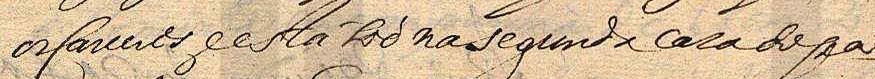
os Carceres e está soó na segunda caza do pa
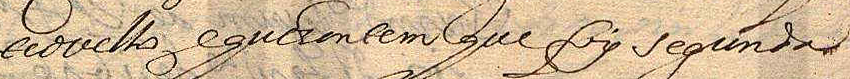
teo velho e que hontem que foy segunda
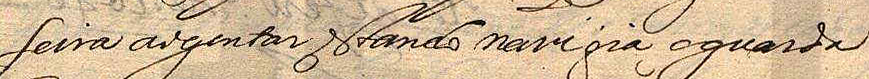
feira ao gentar estando na vigia o guarda
